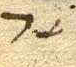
7i
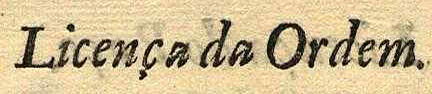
Licença da Ordem.
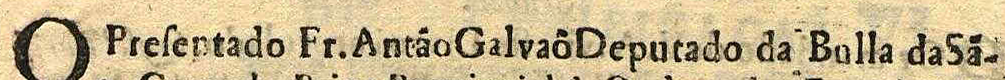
O Presentado Fr. Antão Galvaõ Deputado da Bulla da Sā
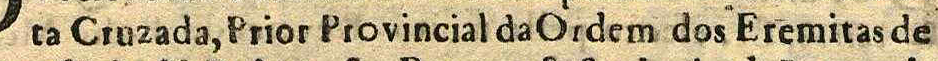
ta Cruzada, Prior Provincial da Ordem dos Eremitas de
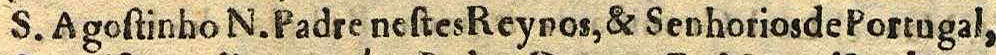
S. Agostinho N. Padre nestes Reynos, & Senhorios de Portugal,
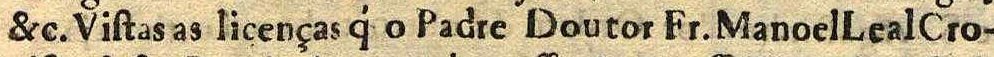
&c. Vistas as licenças q̄ o Padre Doutor Fr. Manoel Leal Cro
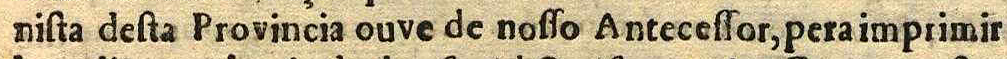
nista desta Provincia ouve de nosso Antecessor, pera imprimir
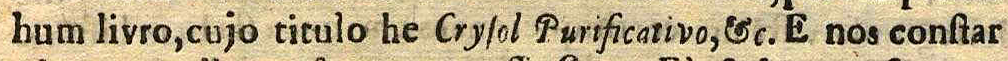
hum livro, cujo ticulo he Crysol Purificativo, &c. E nos constar
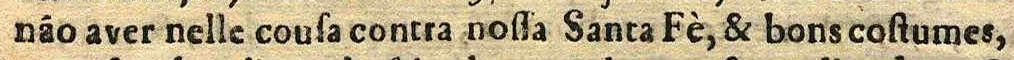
não aver nelle cousa contra nossa Santa Fè, & bons costumes,
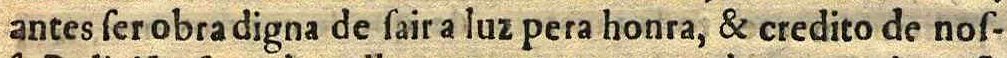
antes ser obra digna de sair a luz pera honra, & credito de nos
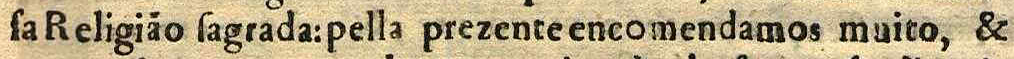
sa Religião sagrada: pella prezente encomendamos muito, &
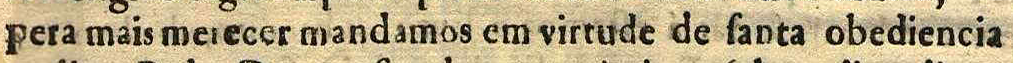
pera mais merecer mandamos em virtude de santa obediencia
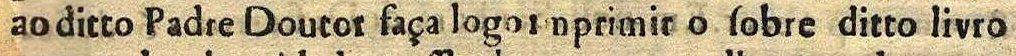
ao ditto Padre Doutor faça logo imprimir o sobreditto livro
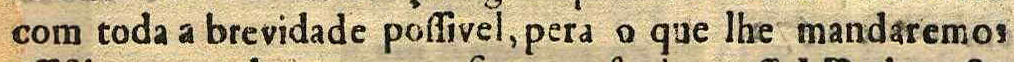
com toda a brevidade possivel, pera o que lhe mandaremos
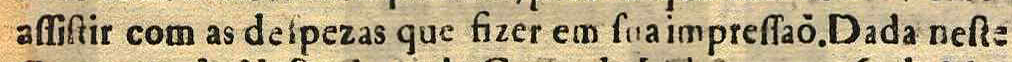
assistir com as despezas que fizer em sua impressaõ. Dada neste
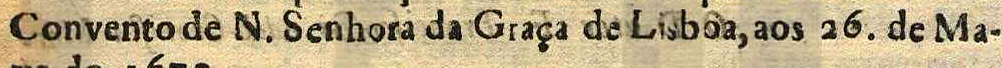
Convento de N. Senhora da Graça de Lisboa, aos 26. de Ma
